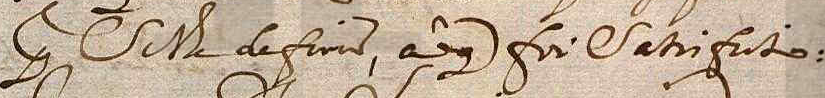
pa Se lhe defirir, ao q̄ foi satisfeito.
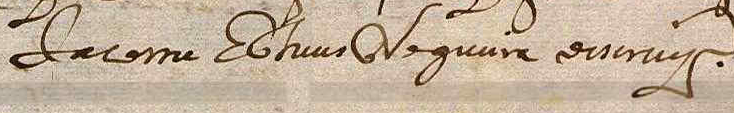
Iacome Esteues Nogueira o escreuj.
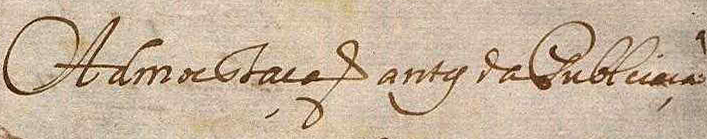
Admoestaçaõ antes da Publicaçaõ
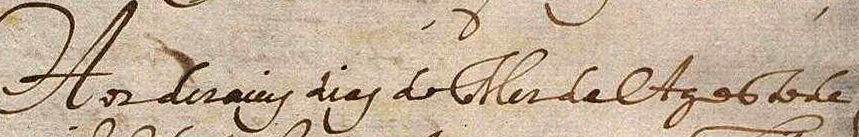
Aos dezaceis dias do Mez de Agosto de
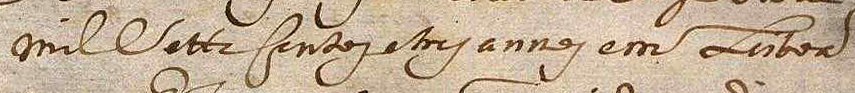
mil SetteCentos e tres annos em Lisboa
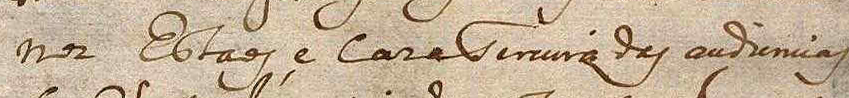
nos Estaos, e Caza Terceira das audiencias
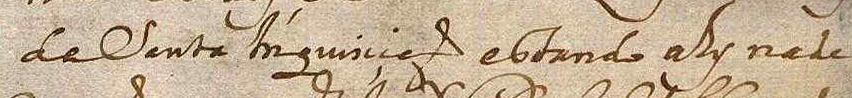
da Santa Inquisiçaõ estando ahy na de
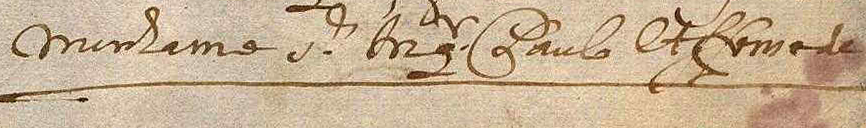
menham o s.or Inq.or Paulo Affonso de
